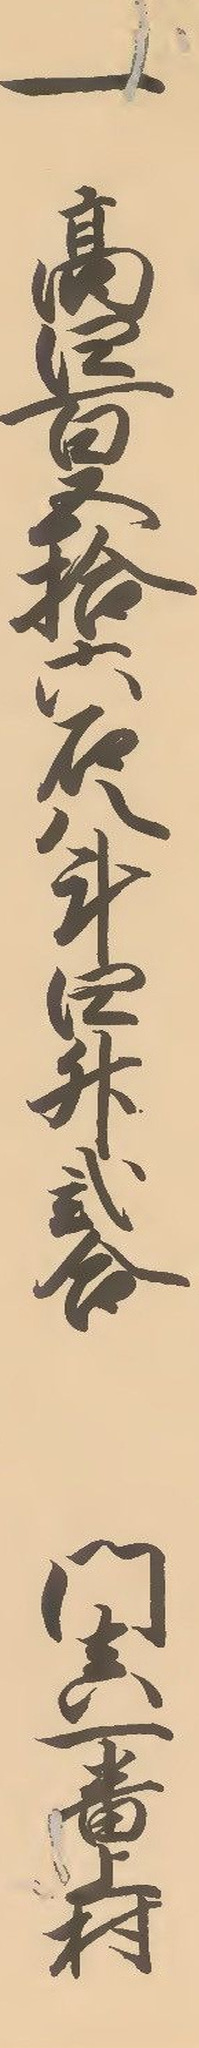一高四百五拾六石八斗四升弐合門真一番上村
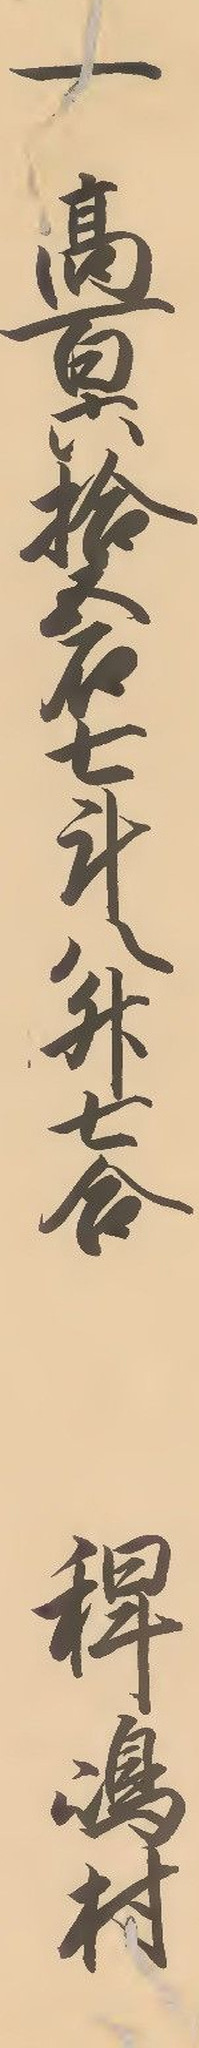一高百六拾五石七斗八升七合稗島村
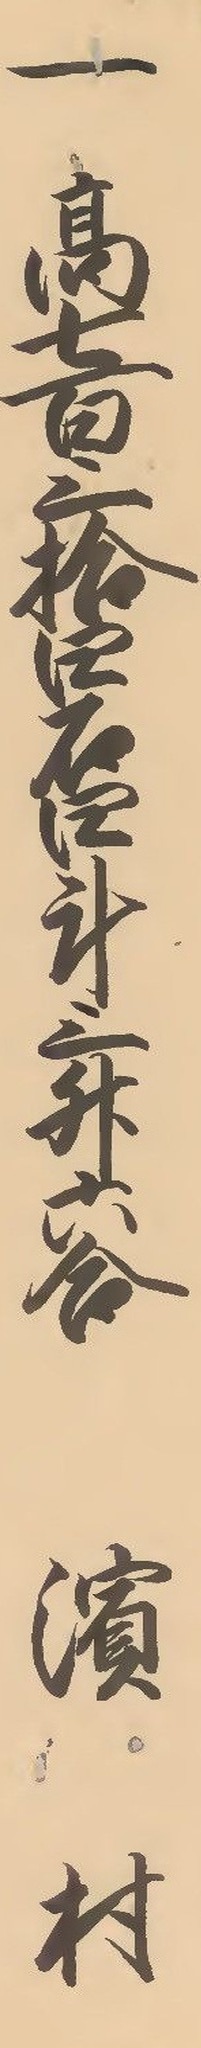一高七百三拾四石四斗三升六合浜村
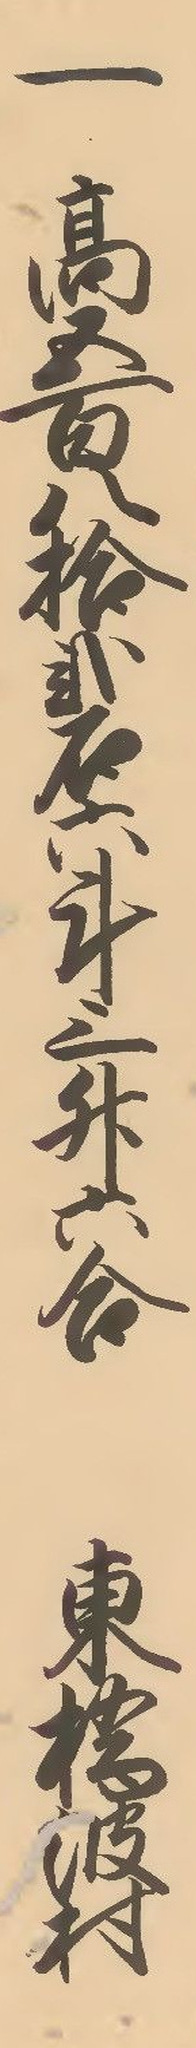一高五百八拾弐石六斗三升六合東橋波村

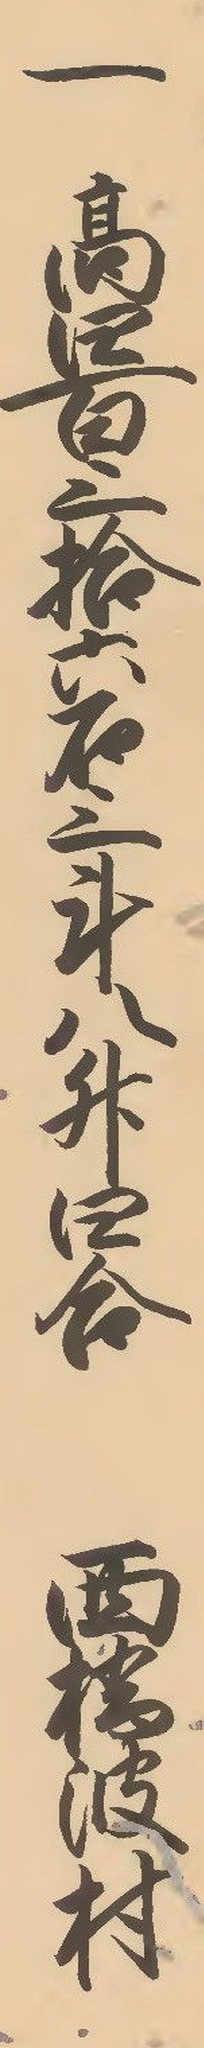一高四百三拾六石三斗八升四合西橋波村
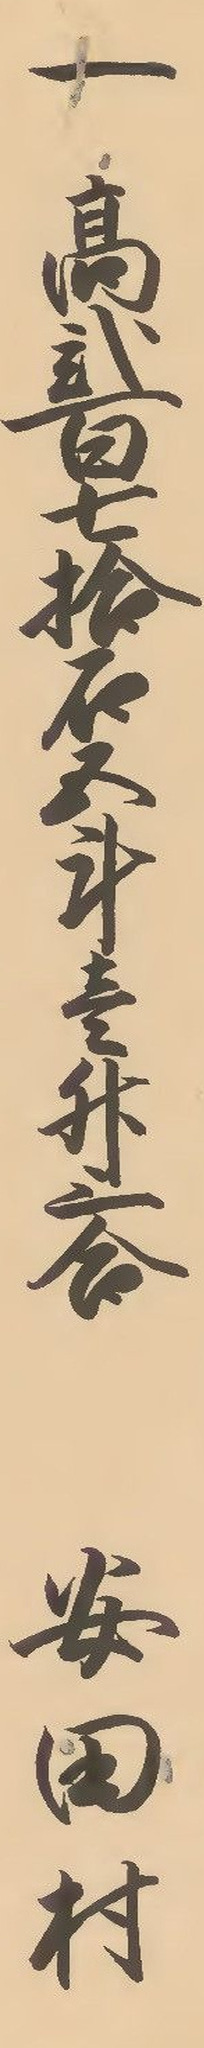一高弐百七拾石五斗壱升三合安田村
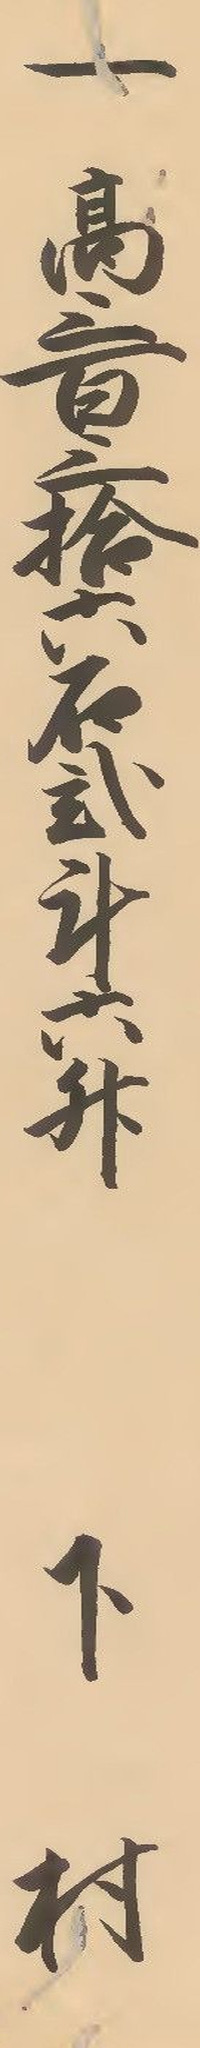一高三百三拾六石弐斗六升下村
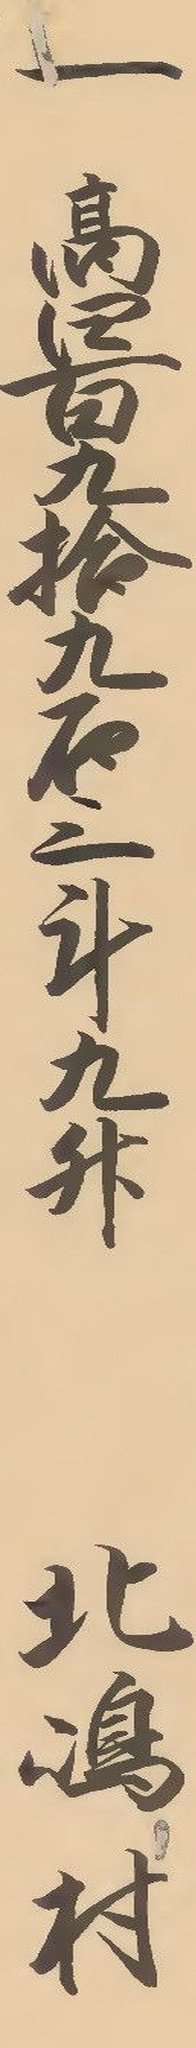一高四百九拾九石三斗九升北島村
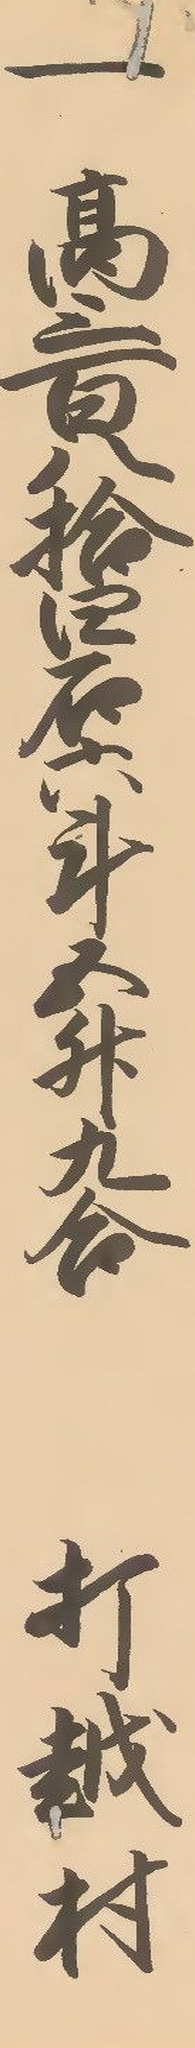一高三百八拾四石六斗五升九合打越村
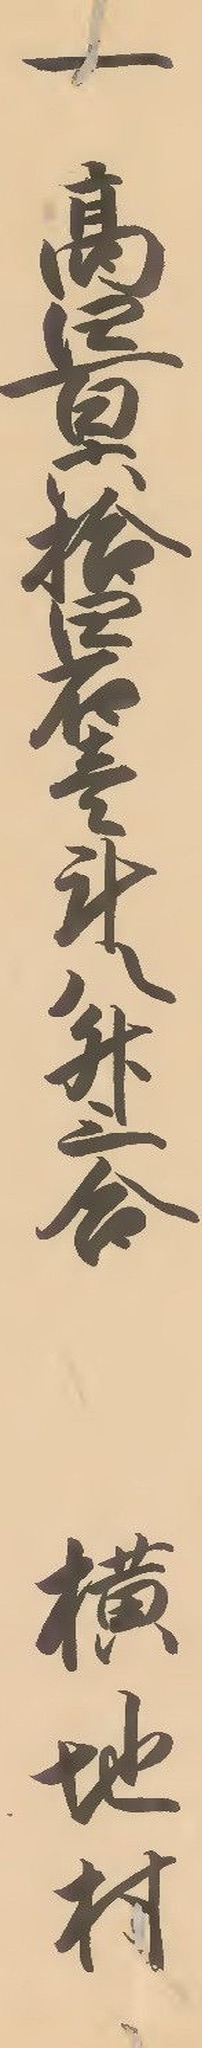一高四百六拾四石壱斗八升三合横地村
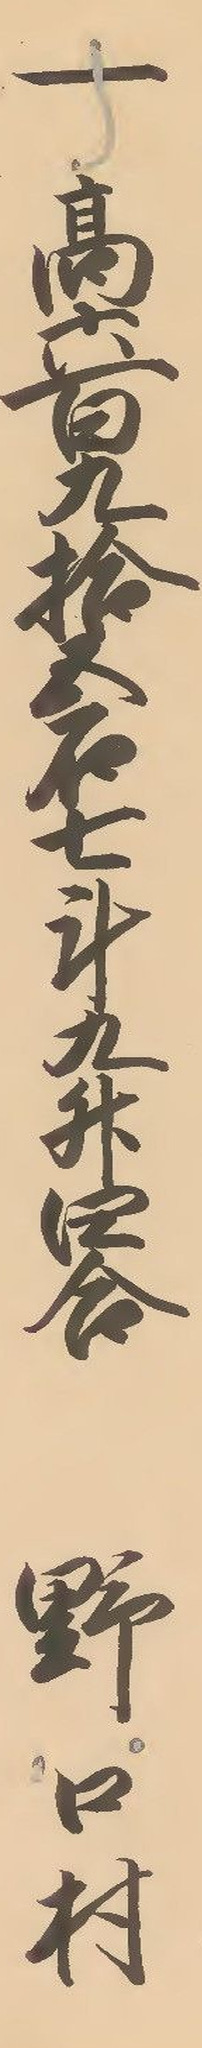一高六百九拾五石七斗九升四合野口村
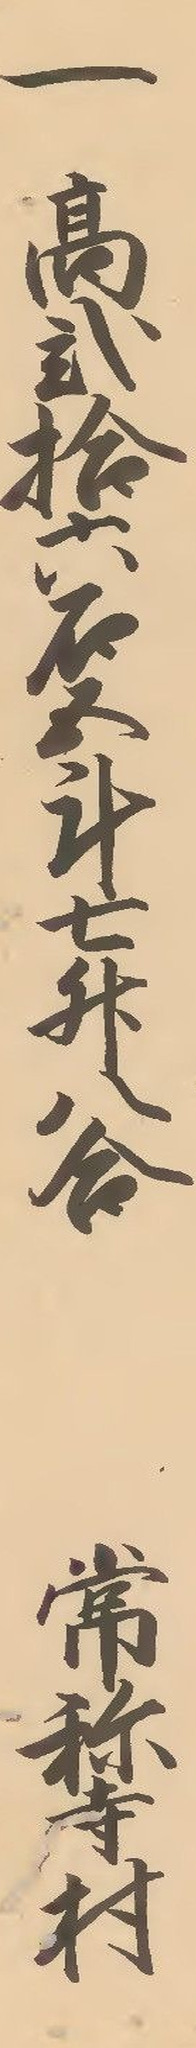一高弐拾六石五斗七升八合常称寺村

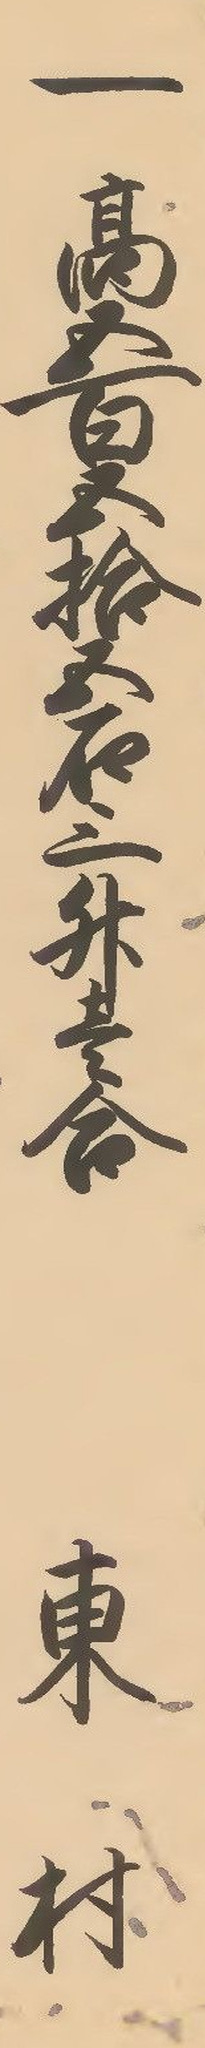一高五百五拾五石三升壱合東村
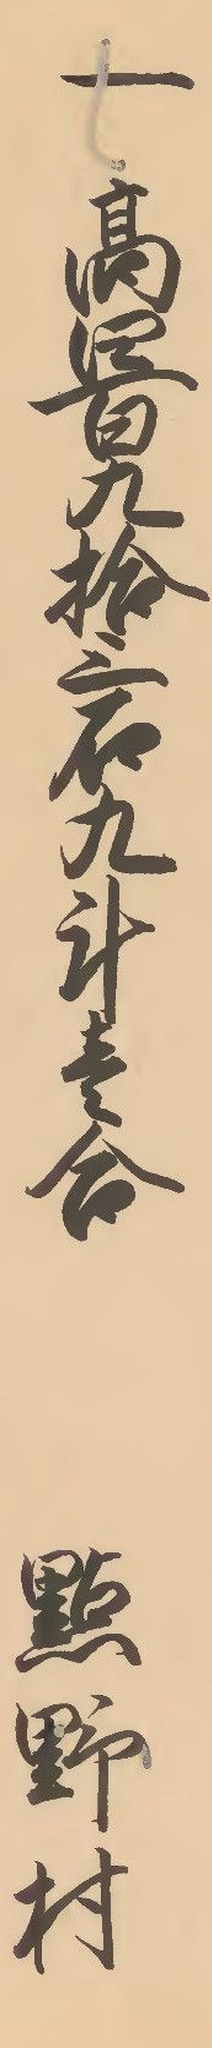一高四百九拾三石九斗壱合点野村
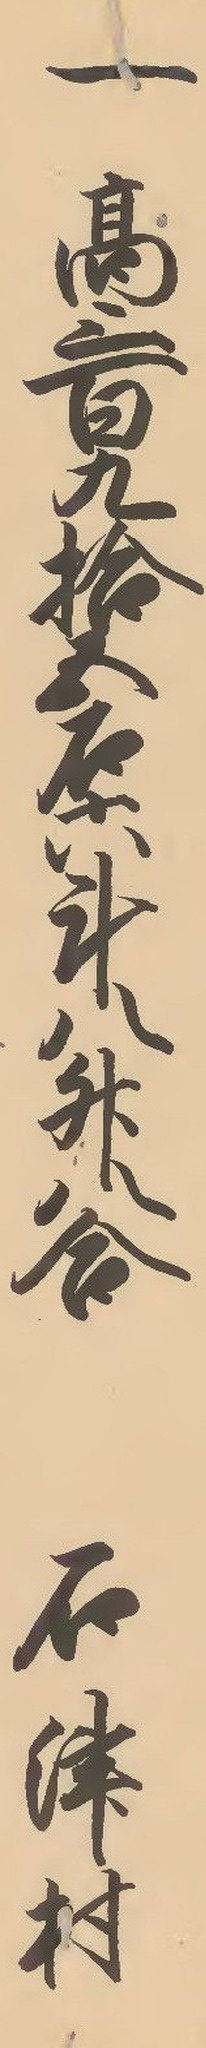一高三百九拾五石六斗八升八合石津村
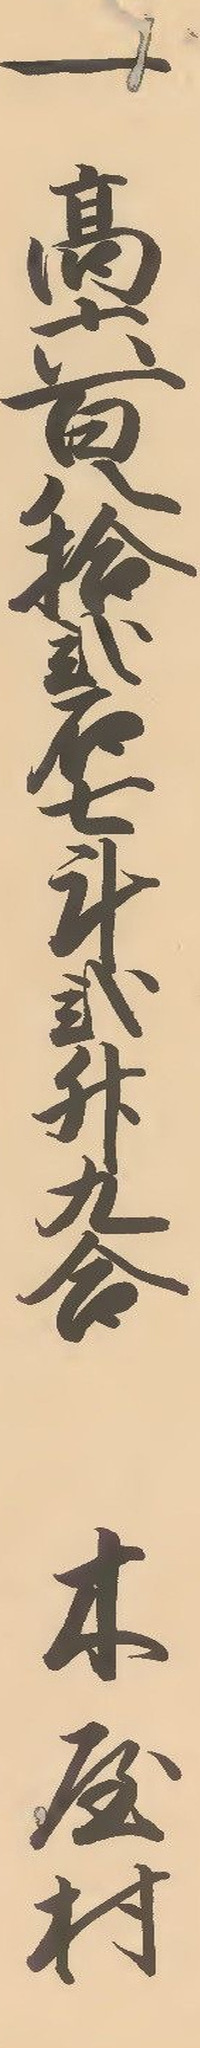一高六百八拾弐石七斗弐升九合木屋村
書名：河内国郷帳
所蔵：国立公文書館 National Archives of Japan
